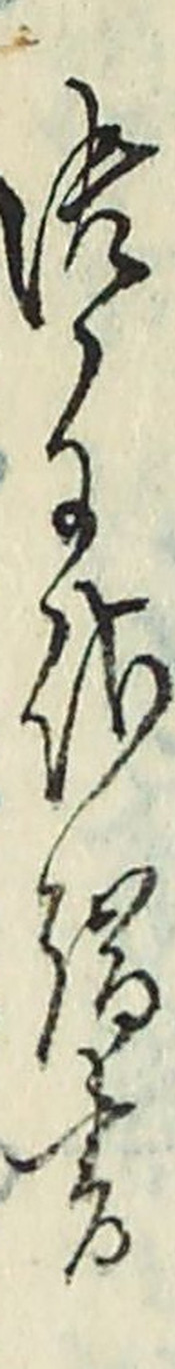御手代端書
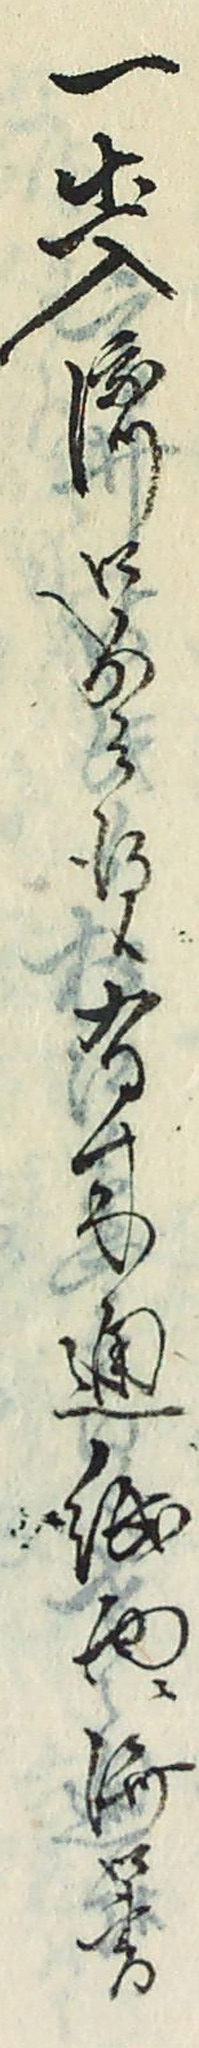一出入済口成候得ハ有来通紙面ニ済口書
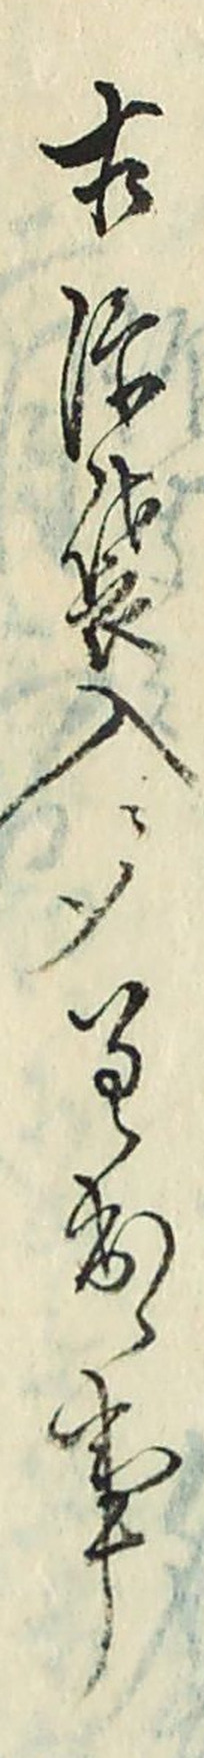相添袋入ニシテ差出候事
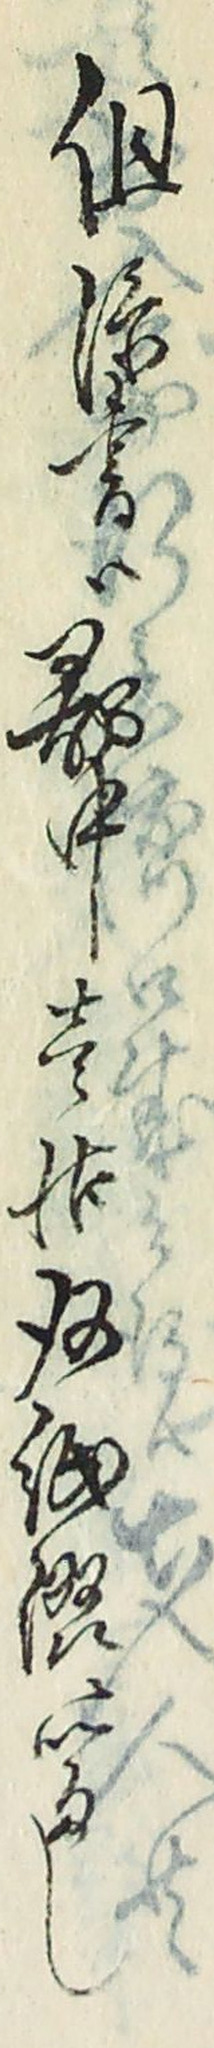但添書ハ郡中壱帖双紙綴ニいたし
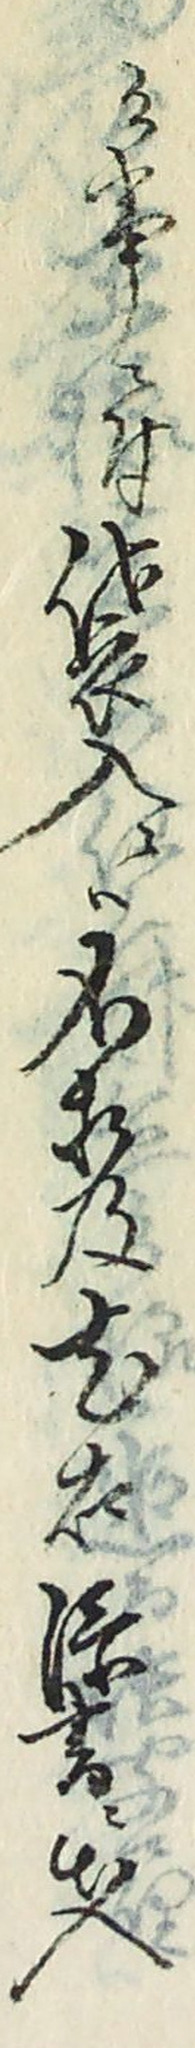候事ニ付袋入ニハ不相及尤右添書ニ出入
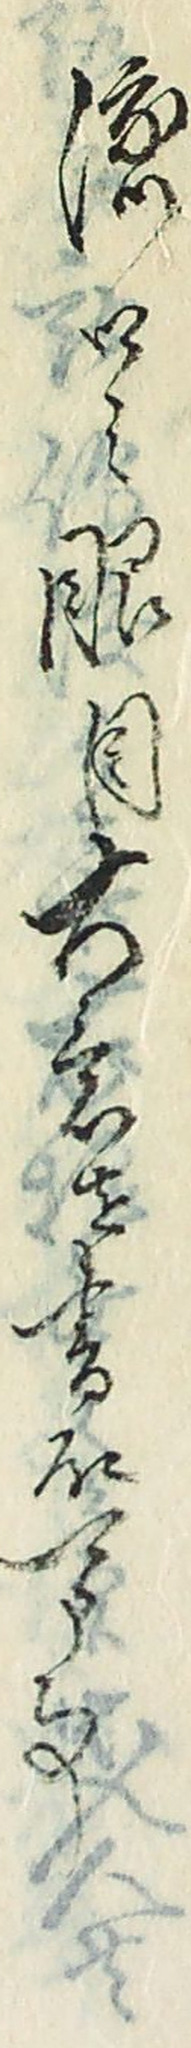済口之眼目大意を書取可申事
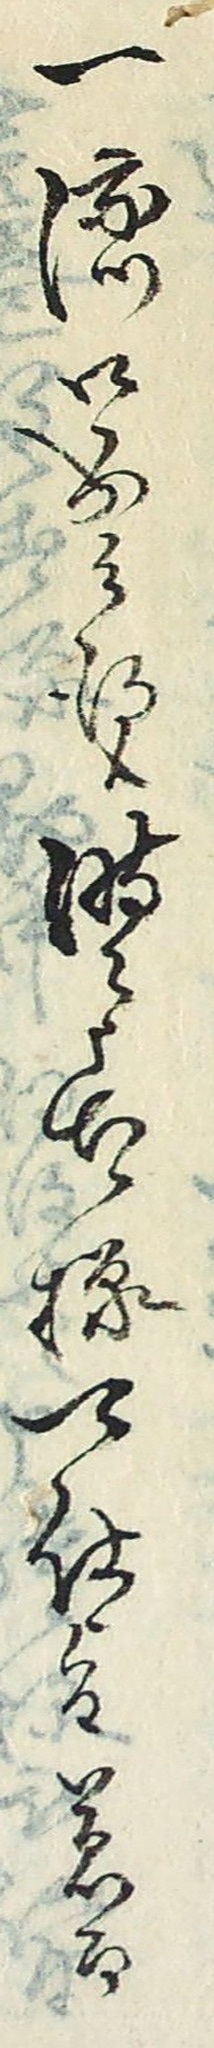一済口成候得ハ時々申出候様可仕旨兼而
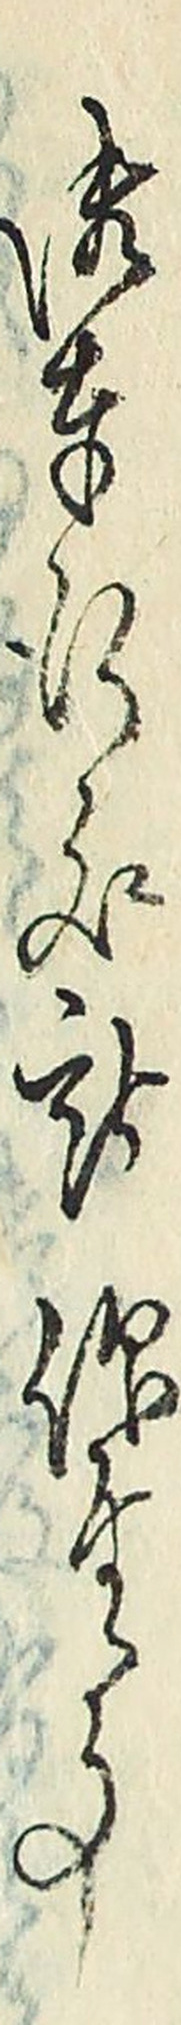御奉行処被仰付候事
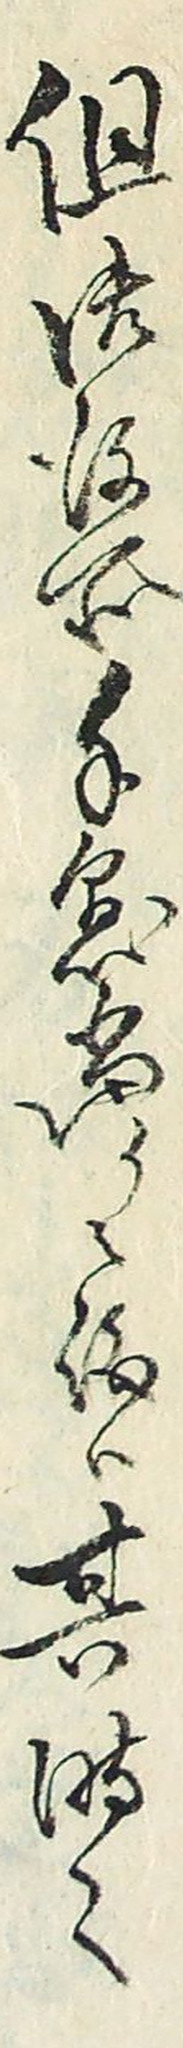但御役所手懸當り之儀ハ其時々

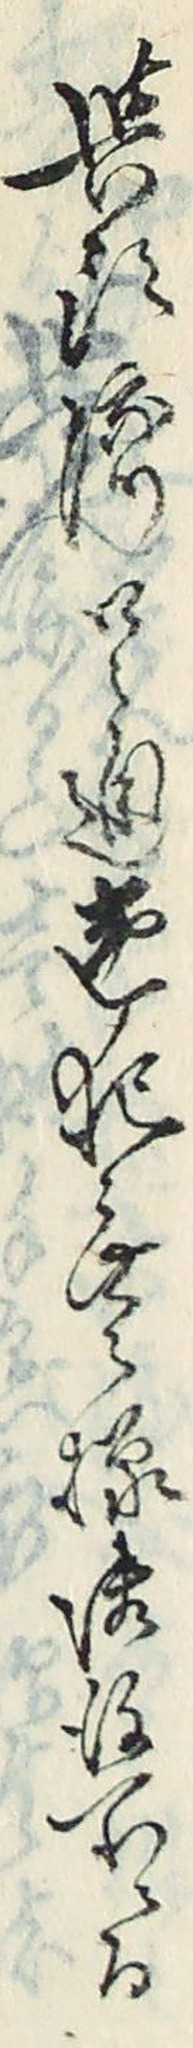與頭済口之通違犯無之様御役所ニ而
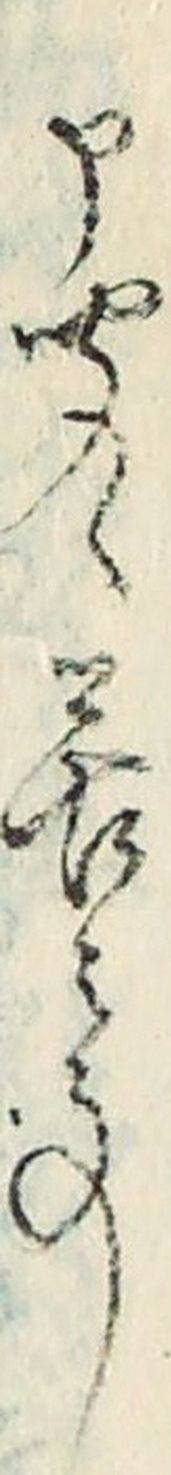申聞候筈之事
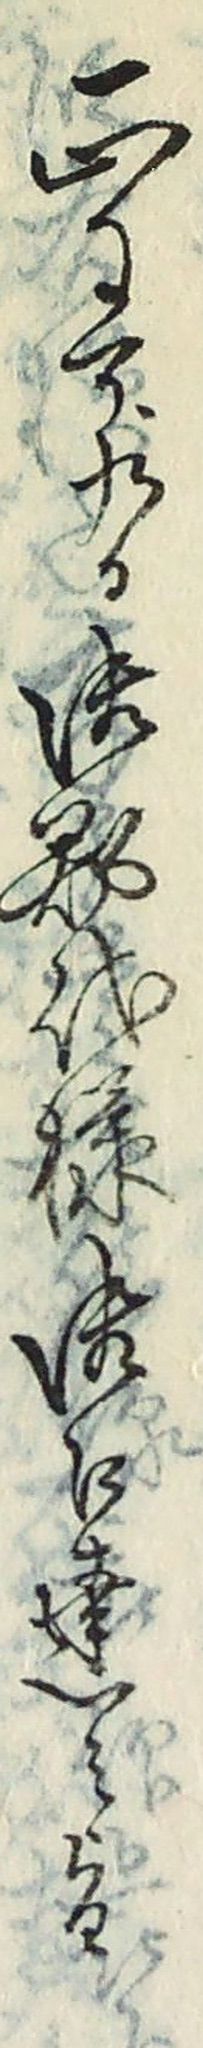正月廿九日御郡代様御口達之旨
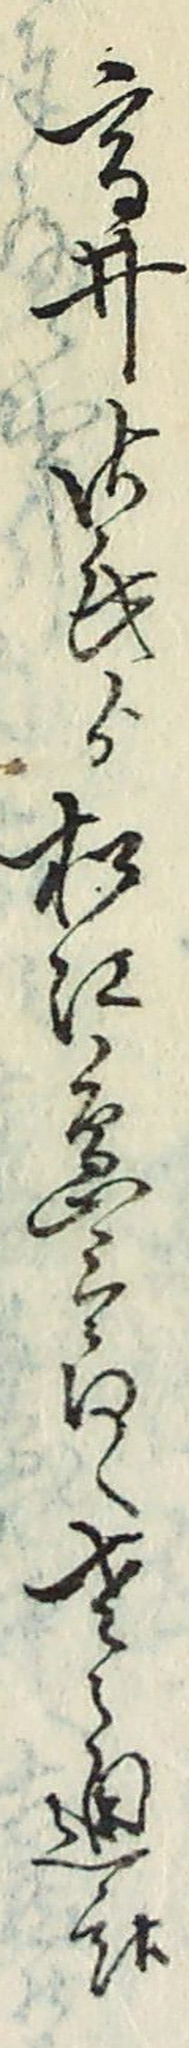高井與氏ゟ松江嶋三郎へ左之通被
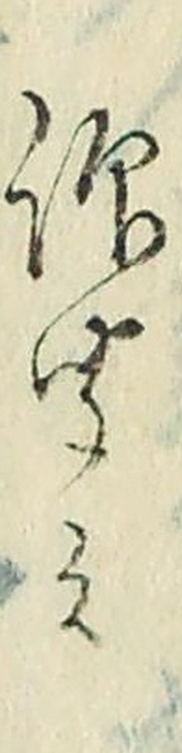仰聞候
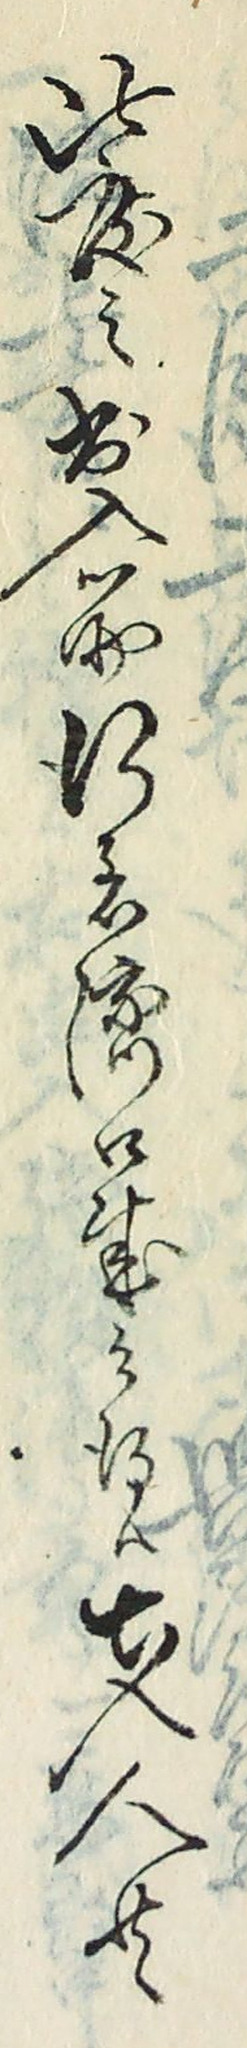此度之出入筋行着済口成候得ハ出入人共
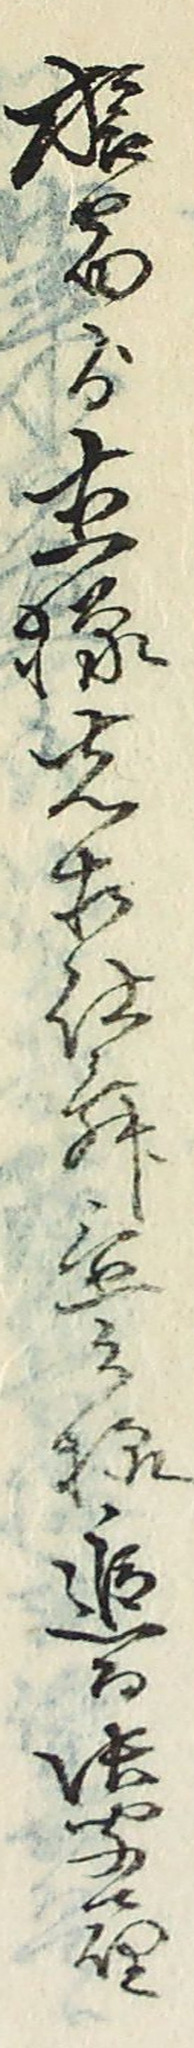旅宿ゟ直様先相仕舞置候様追而御聞届
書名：諸御趣意書并御下知向之写
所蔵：鳴門教育大学 Naruto University of Education
